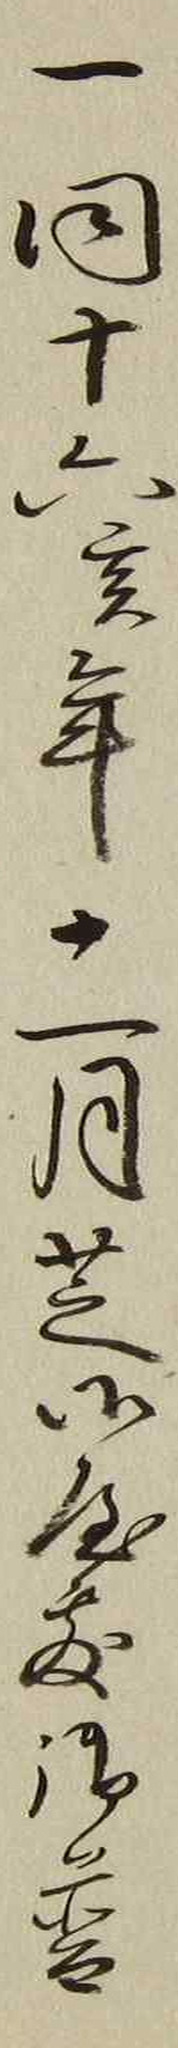一同十六亥年十一月芝御屋敷御普
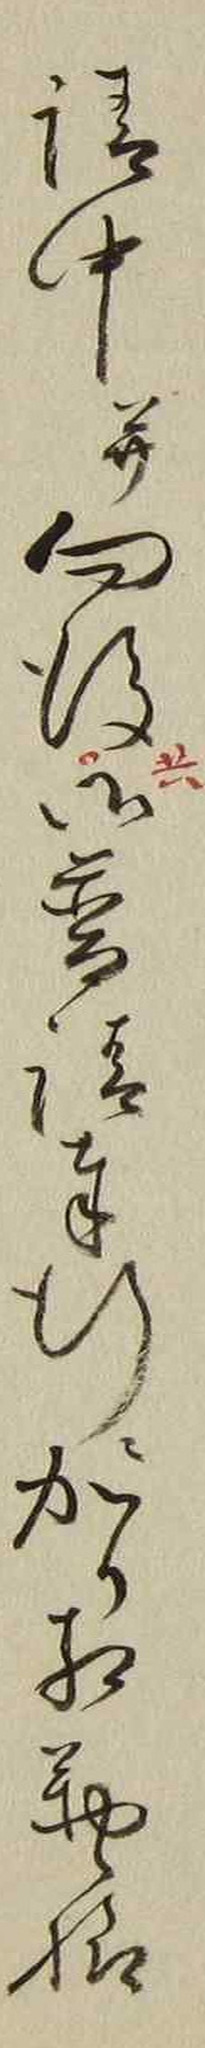請中并向後◦御普請奉行ニ加り相勤候様
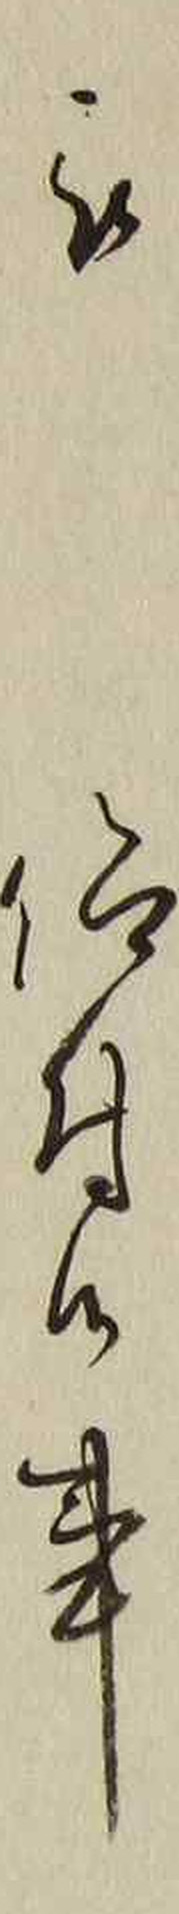被仰付候事
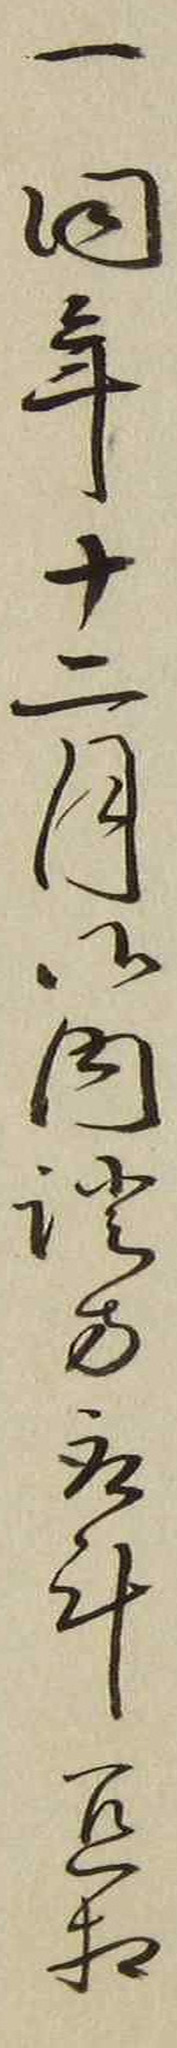一同年十二月御内証方取計宜相

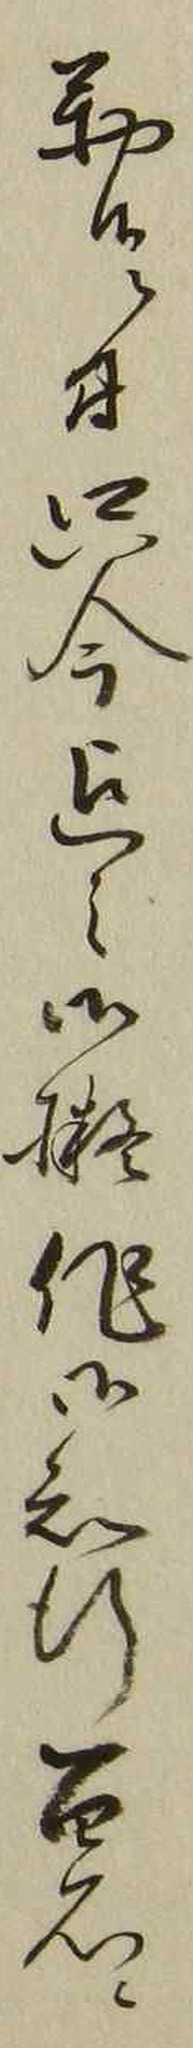勤候ニ付只今迄之御擬作御知行百石ニ
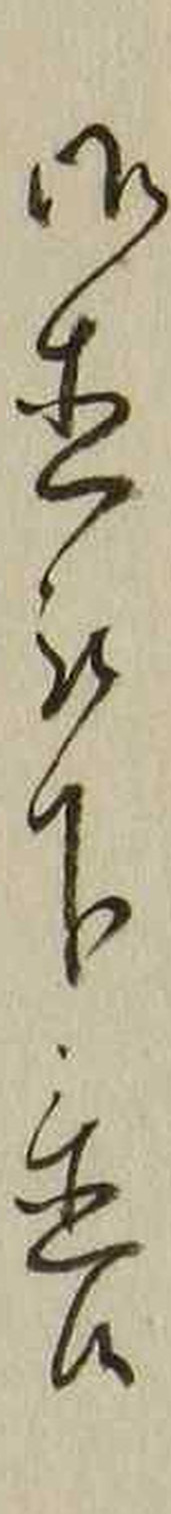御直被下置候
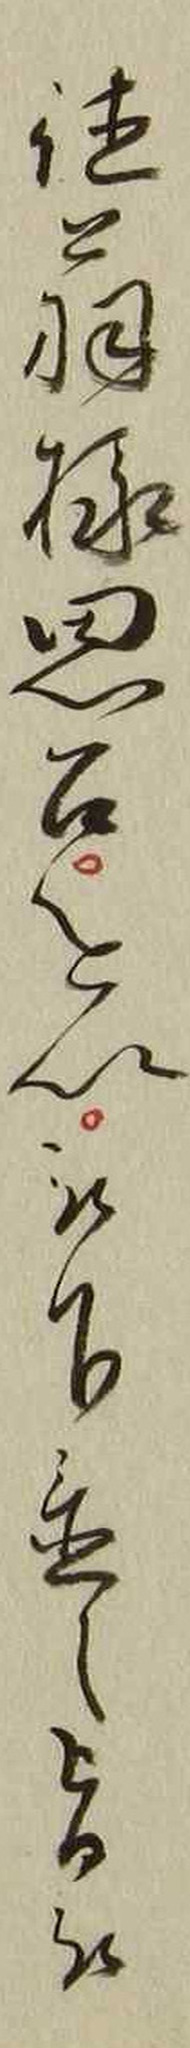徳翁様思召◦を以◦被下置之旨被
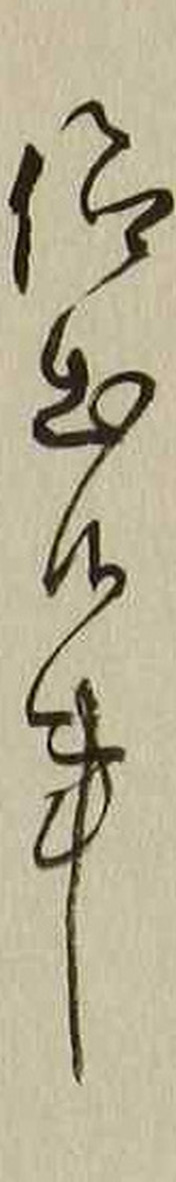仰出候事
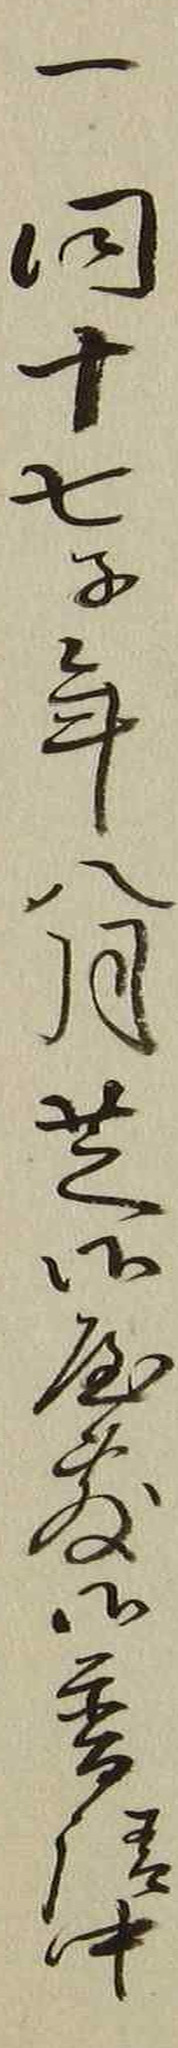一同十七子年八月芝御屋敷御普請中
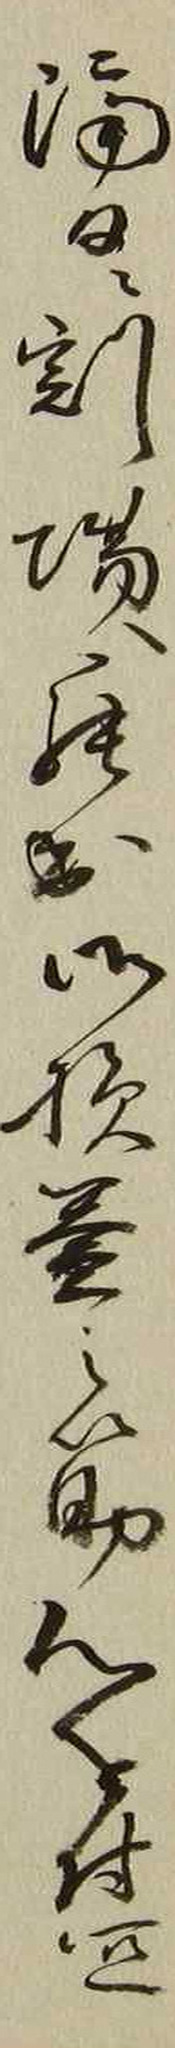隔日ニ割場へ罷出御損益之筋心を付宜
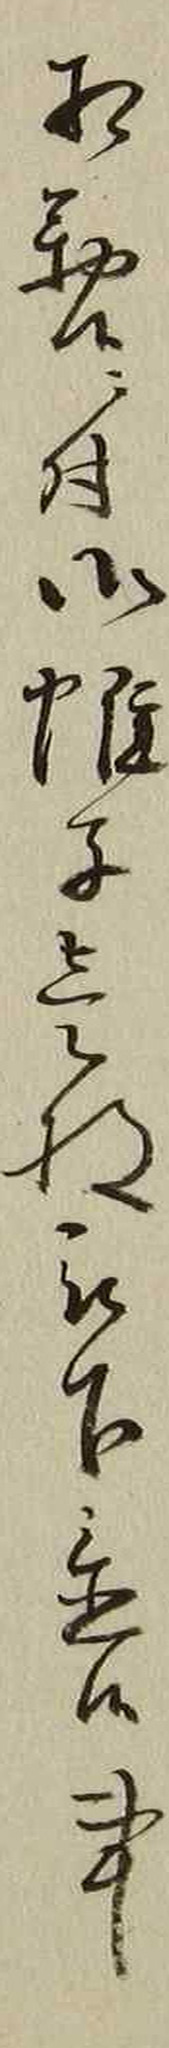相勤候ニ付御帷子壱枚被下置候事
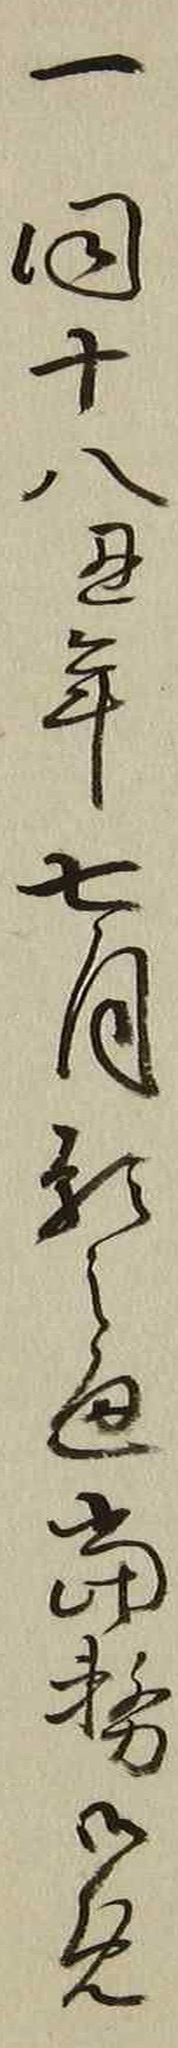一同十八丑年七月願之通当務御免
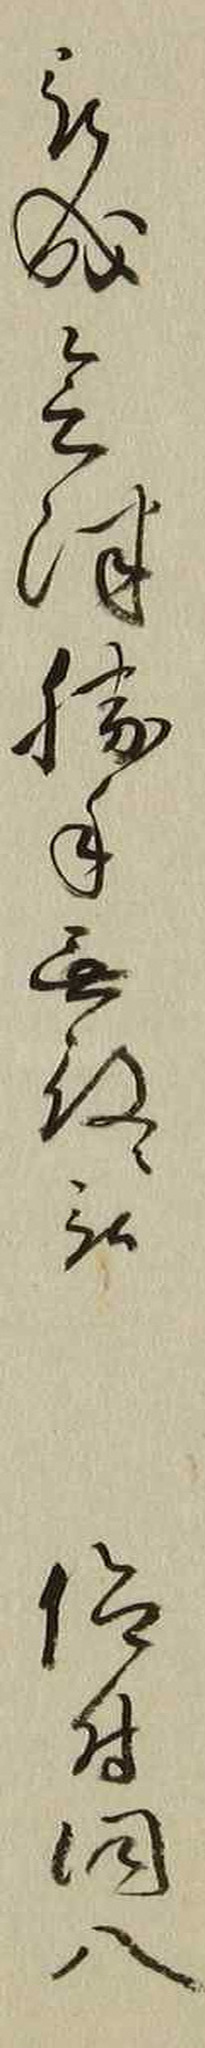被成会津勝手無役にニ被仰付同八
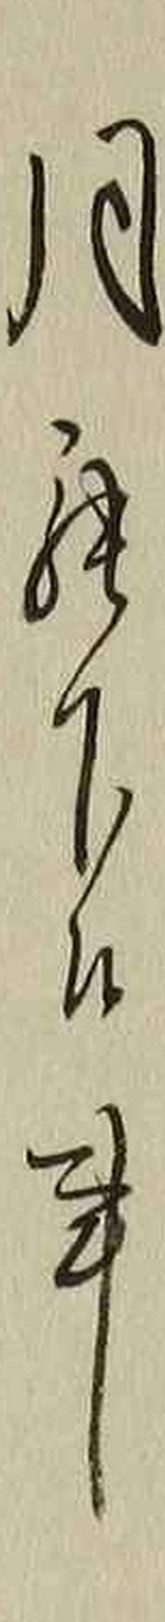月罷下候事
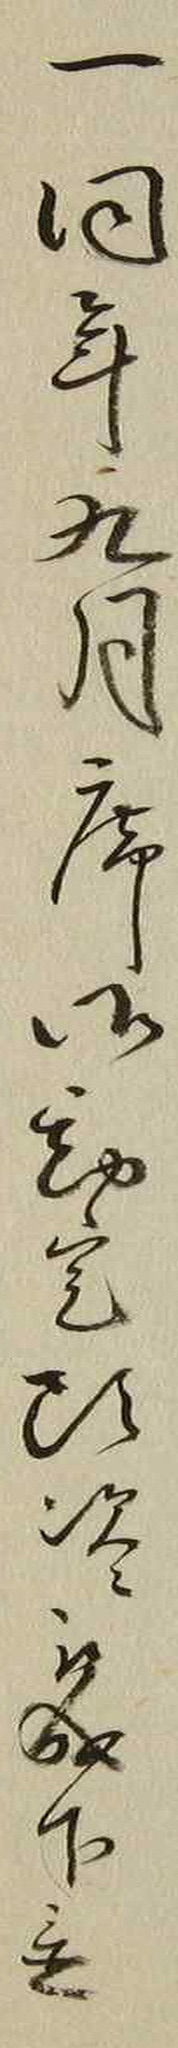一同年九月席御勘定頭次ニ被成下置
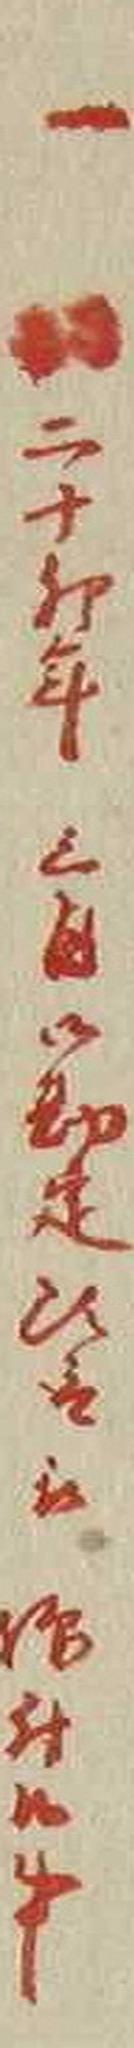一同二十卯年三月御勘定頭取被仰付候事
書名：諸士系譜　巻之4　い之部4
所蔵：会津若松市立会津図書館
